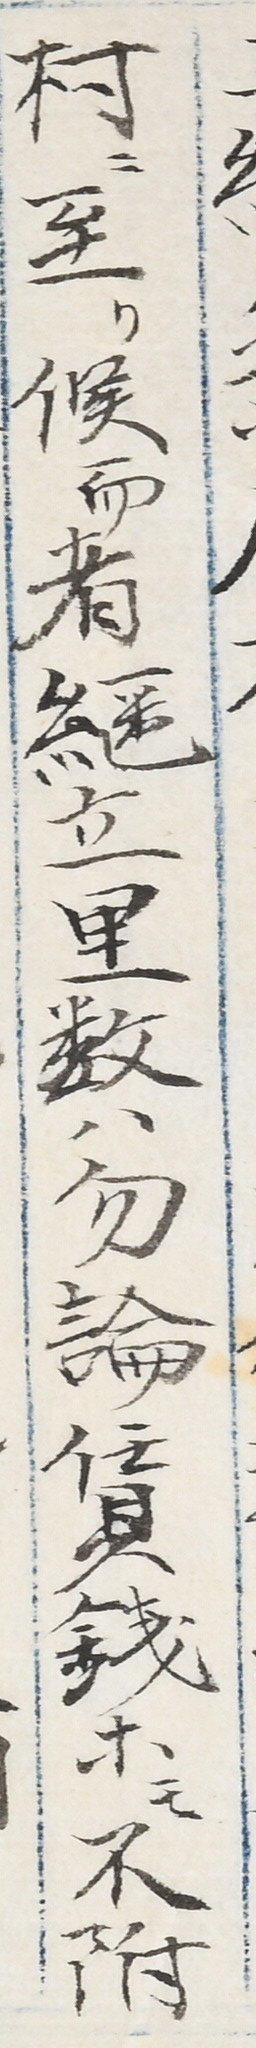村ニ至リ候而者継立里数ハ勿論賃銭等モ不附
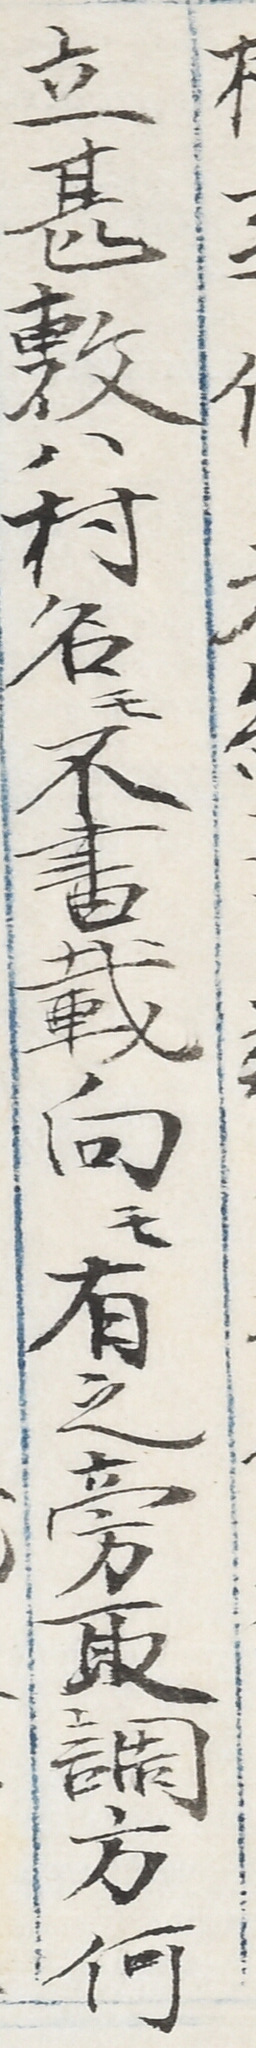立甚敷ハ村名モ不書載向モ有之旁取調方何
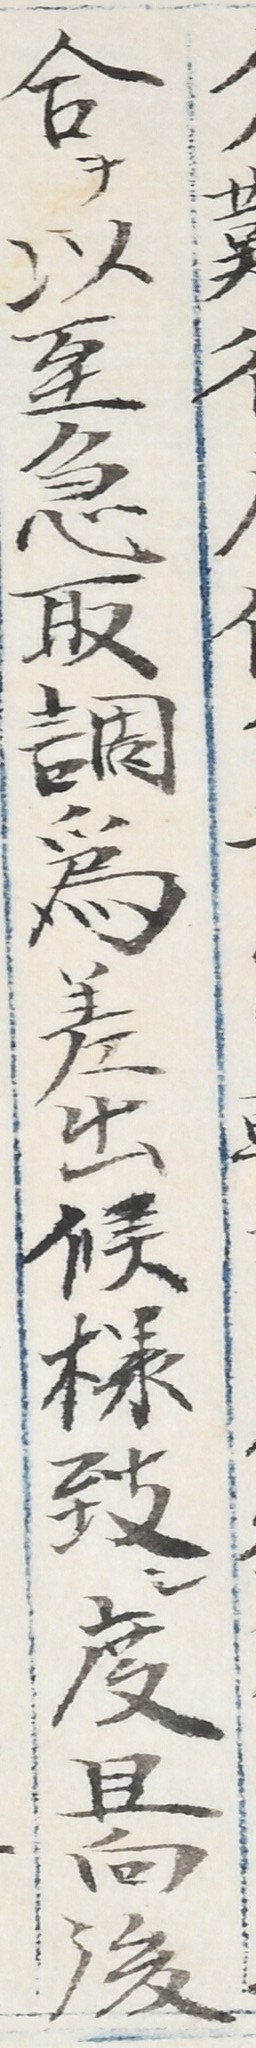合ヲ以至急取調為差出候様致シ度且向後
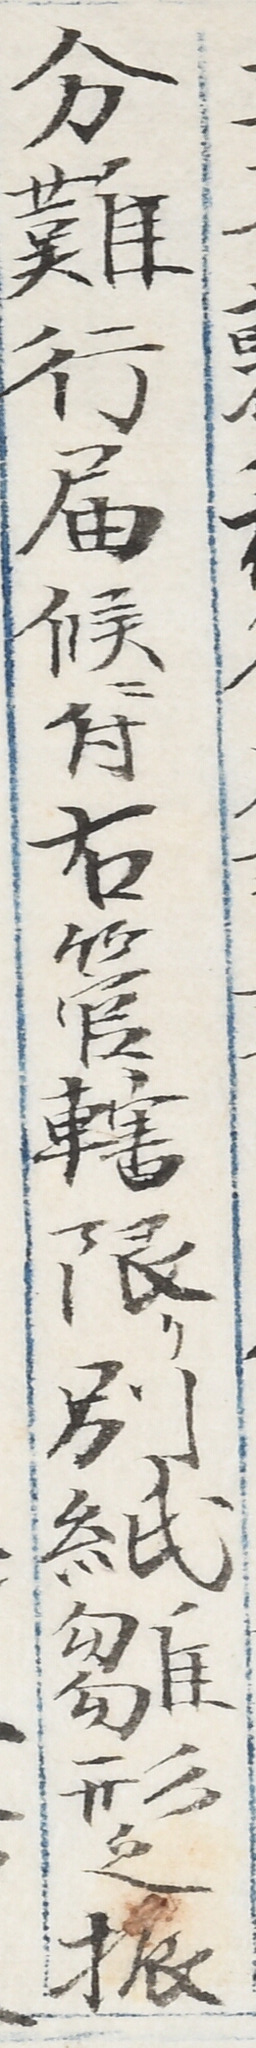分難行届候ニ付右管轄限リ別紙雛形之振
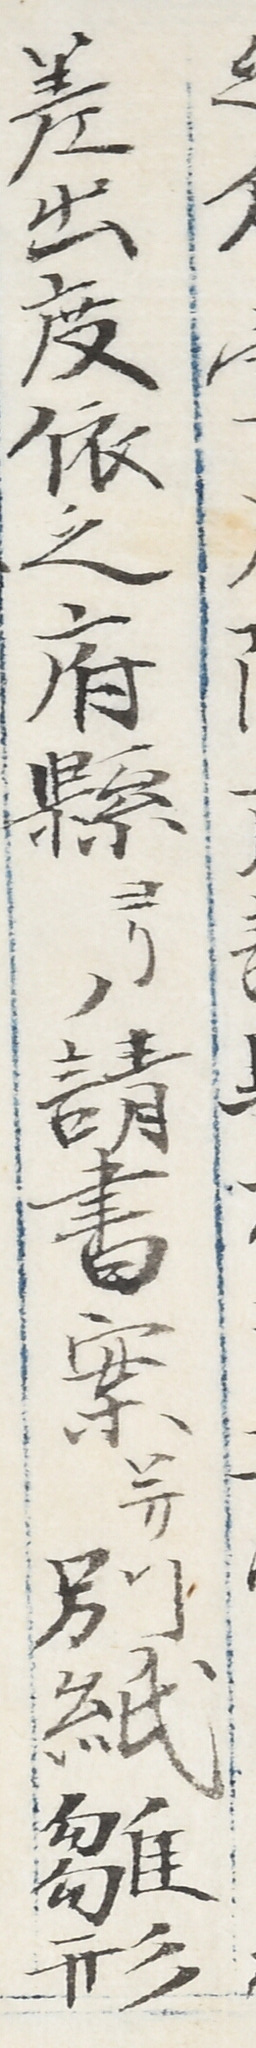差出度依之府県ヨリノ請書案幷別紙雛形
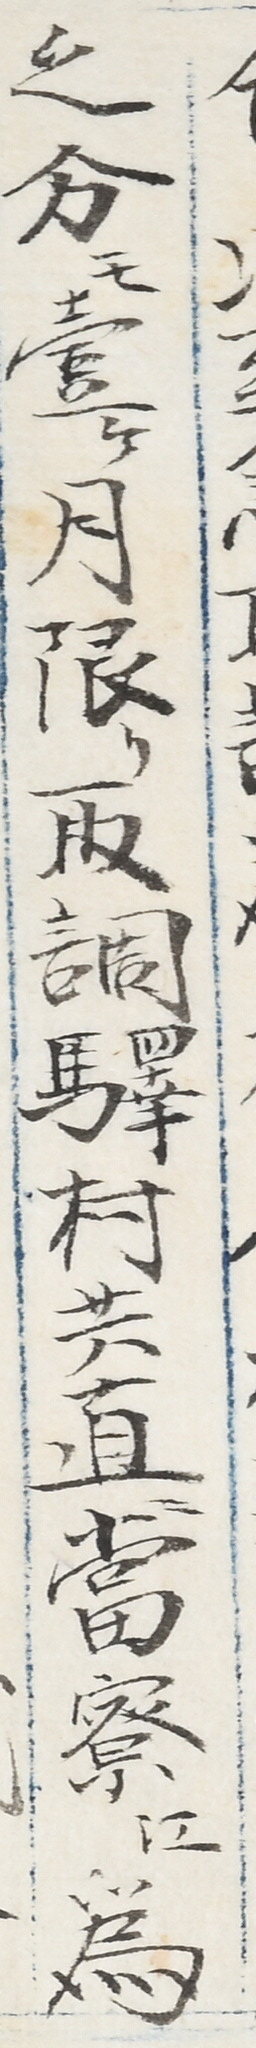之分モ壱ケ月限リ取調駅村共直ニ当寮江為
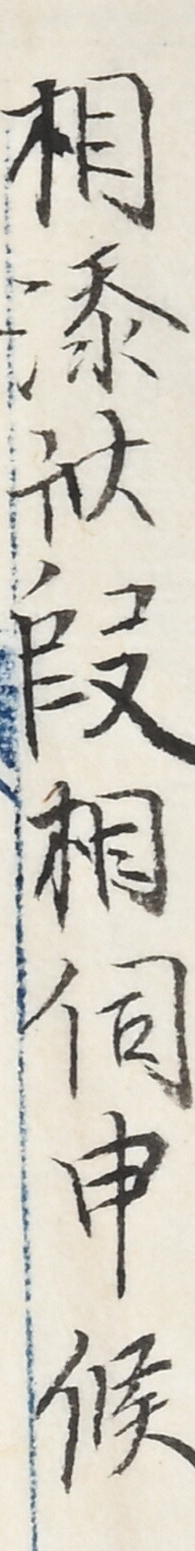相添此段相伺申候

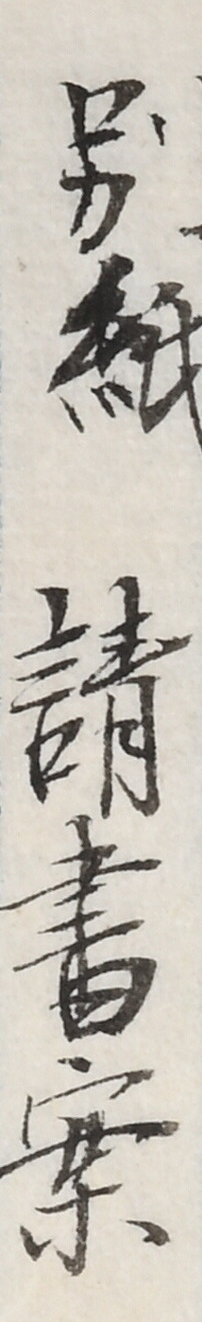別紙請書案
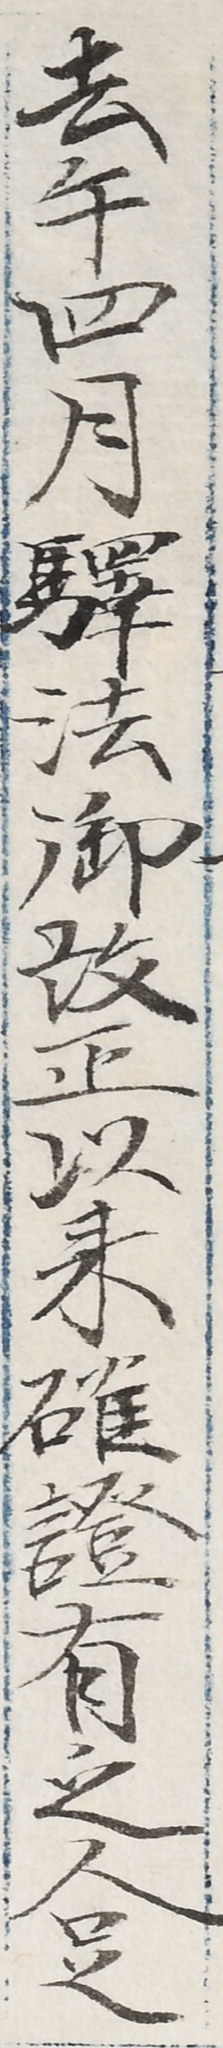去午四月駅法御改正以来確証有之人足
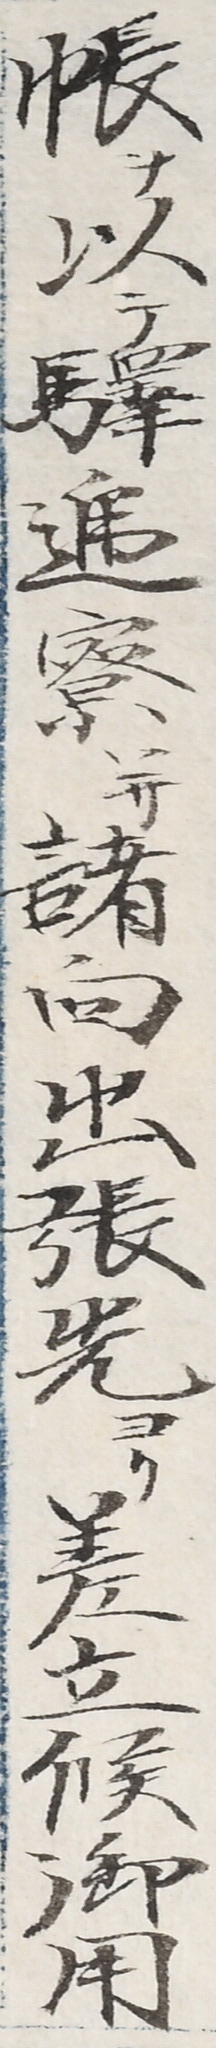帳ヲ以テ駅逓寮幷諸向出張先ヨリ差立候御用
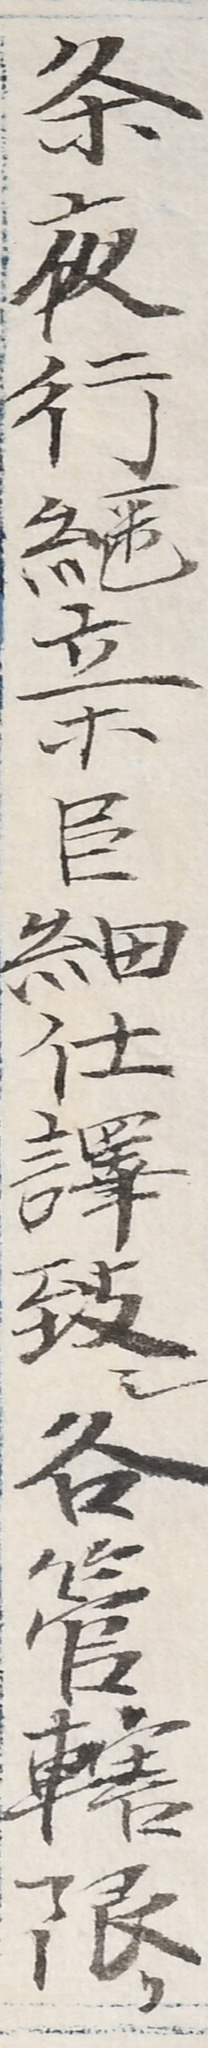条夜行継立等巨細仕訳致シ各管轄限リ
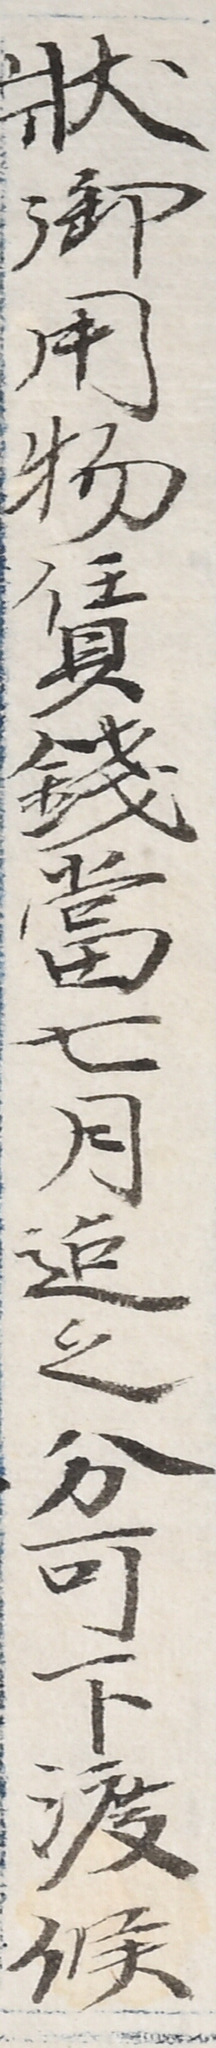状御用物賃銭当七月迄之分可下渡候
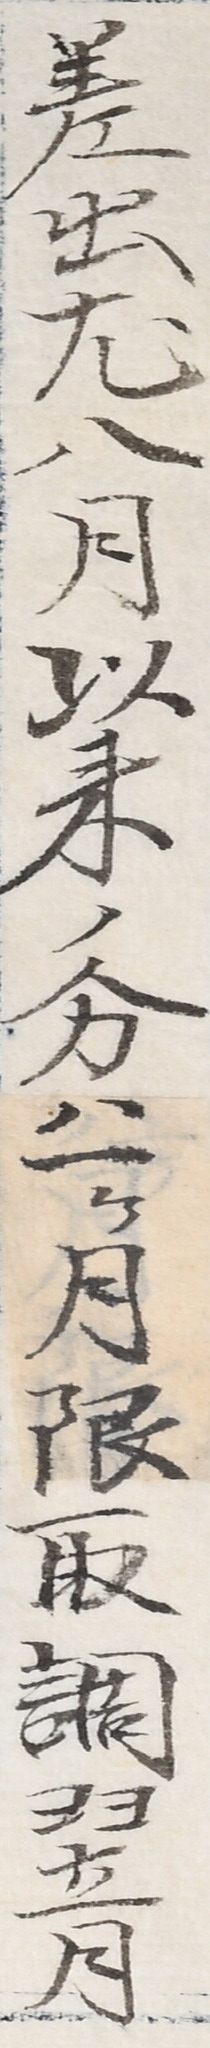差出尤八月以来ノ分ハ一ケ月限取調翌月
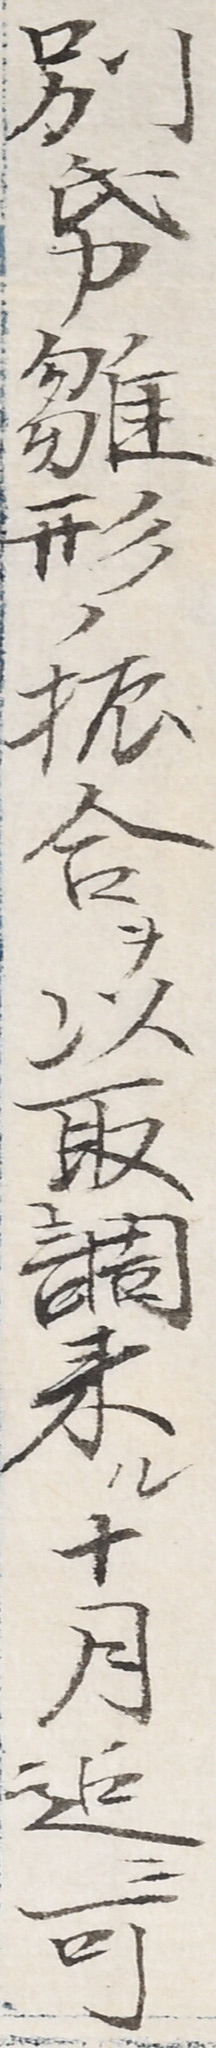別紙雛形ノ振合ヲ以取調来ル十月迄ニ可
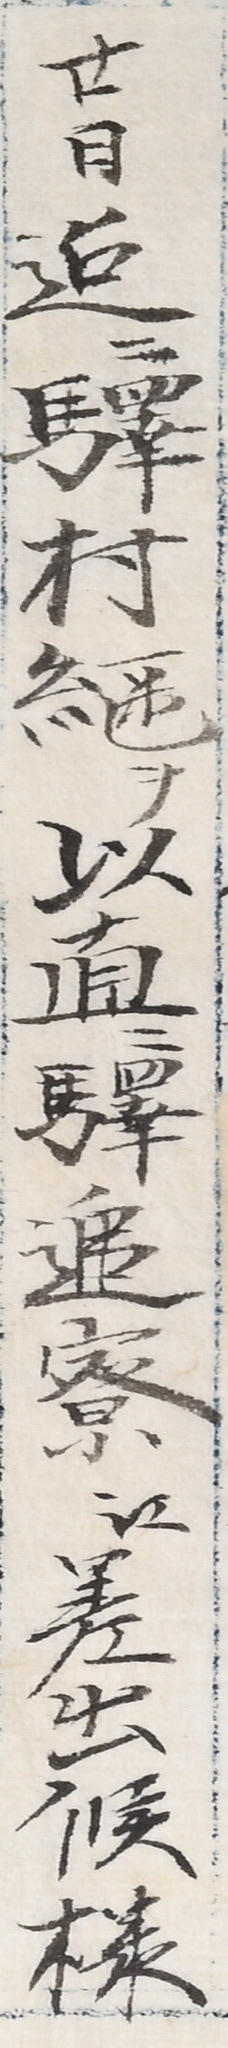廿日迄ニ駅村継ヲ以直ニ駅逓寮江差出候様
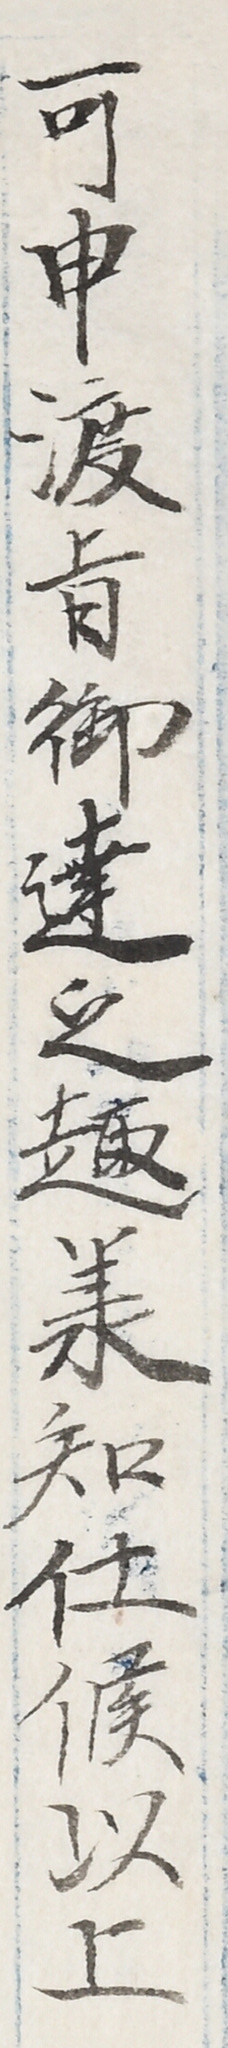可申渡旨御達之趣承知仕候以上
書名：（通達）
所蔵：伊那市立高遠町図書館・合同会社AMANE
